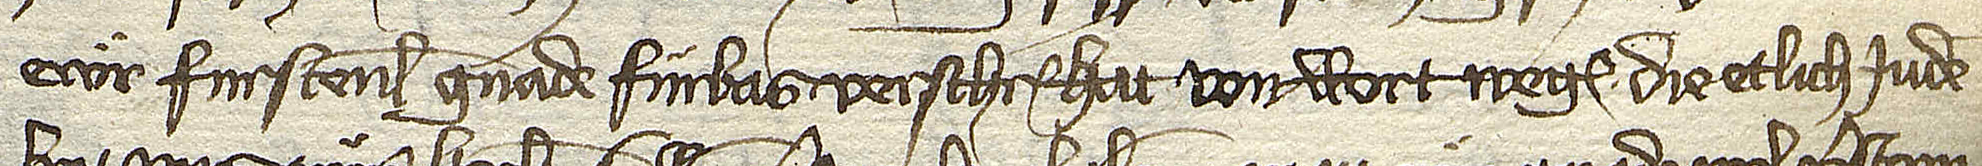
eẅr furſtenl* gnade fürbas verſchr* hat von wort weg* . die etlich Iude*
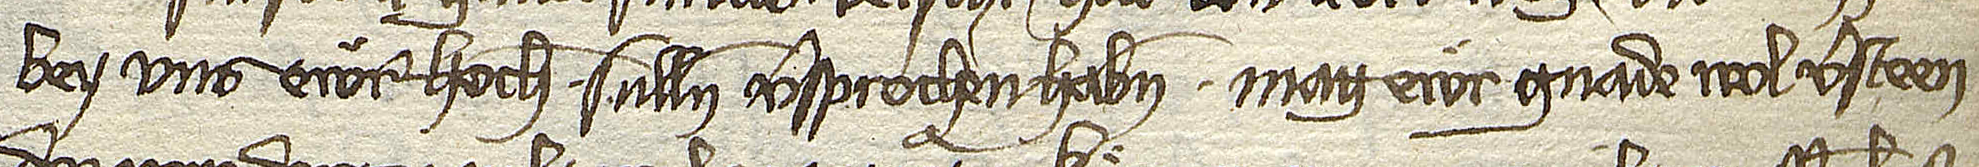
bey vns eẅr hoch* . ſulln* v*ſprochen habn* . mag eẅr gnade wol v*ſteen
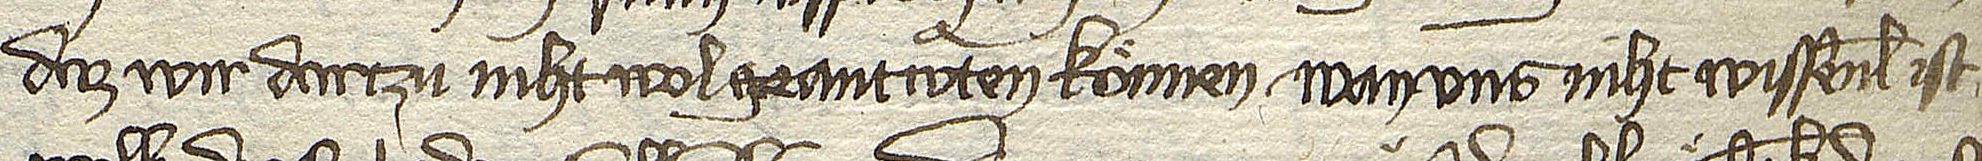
daʒ wir darcʒu niht wol geantw*ten können / wan vns niht wiſſenl* iſt
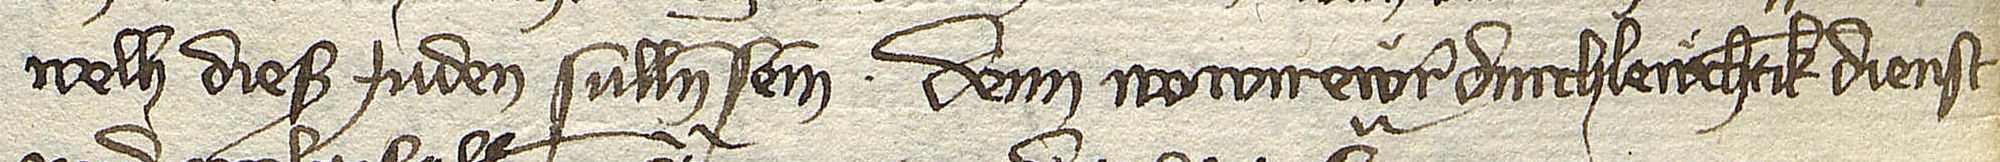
welh dieſ* Iuden ſulln* ſein . Denn wo wir eẅr* durchleẅchtik* dienſt
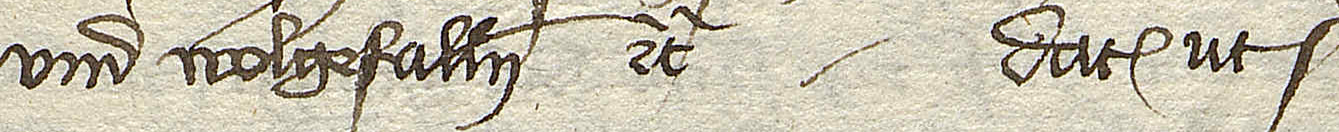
vnd wolgefalln* ec* / Dat* ut ſ*
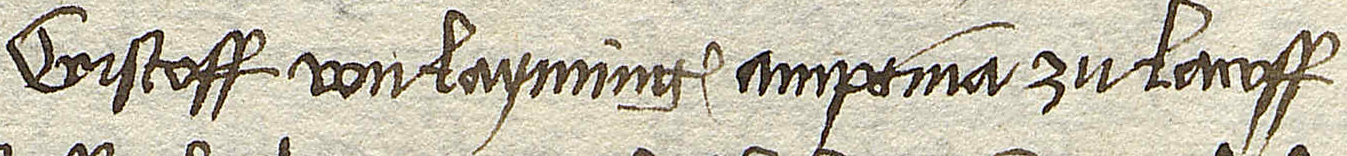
Criſtoff von layning* amptma* ʒu Lawff
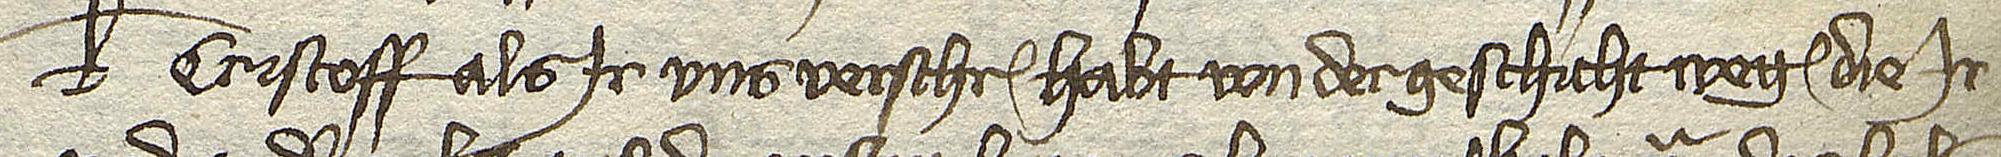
L* Criſtoff als Ir vns verſchr* habt von der geſchicht weg* die Ir
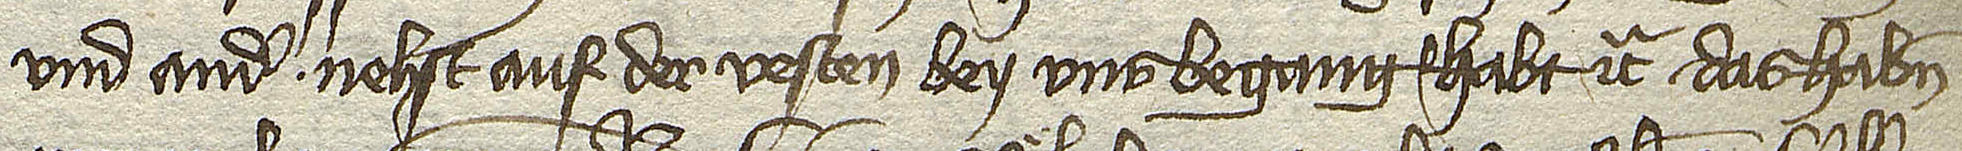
vnd and* . nehſt auf der veſten bey vns begang* habt ec* / das habn*
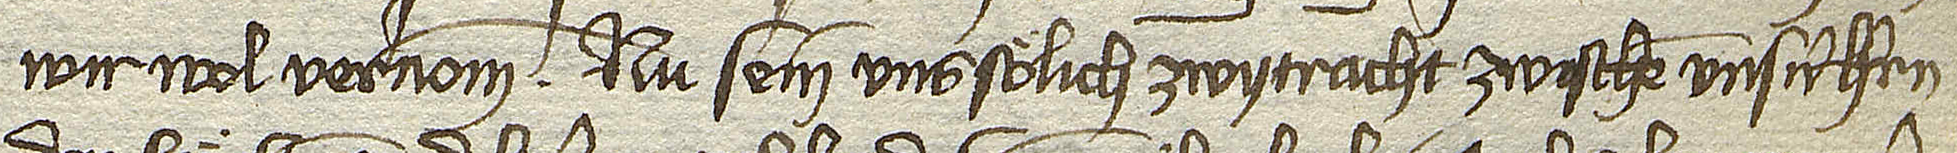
wir wol vernom* . Nu ſein vns ſölich ʒwytracht ʒwiſche* vnſn* h*rn
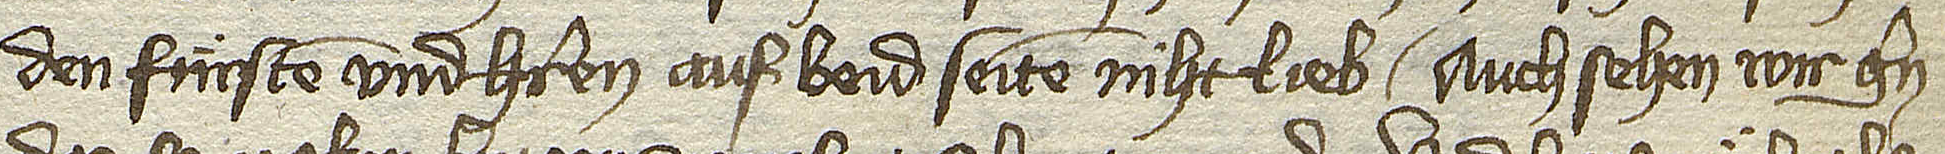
den fürſte* vnd h*ren auf beid ſeite* niht lieb / Auch ſehen wir g*n
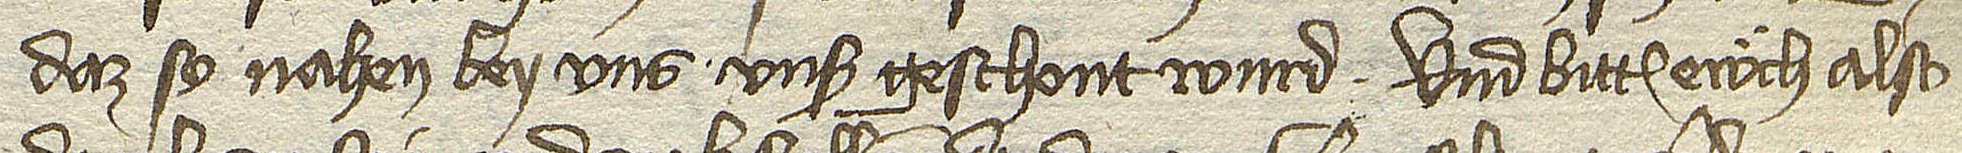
daʒ ſo nahen bey vns . vnſ* geſchont wurd . Vnd bitt* eẅch alſo
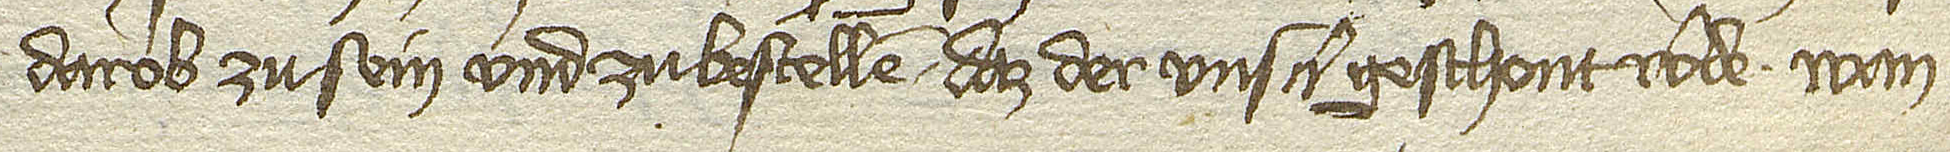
darob ʒu ſein vnd ʒu beſtelle* / daʒ der vnſn* geſchont w*de . wan
